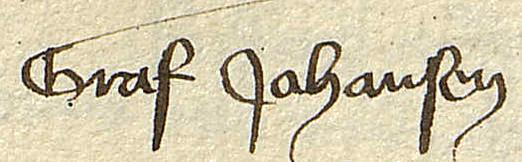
Graf Iohanſen
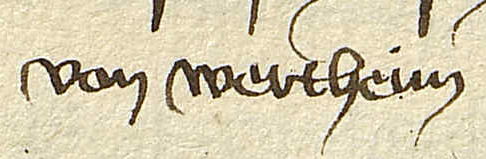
von wertheim
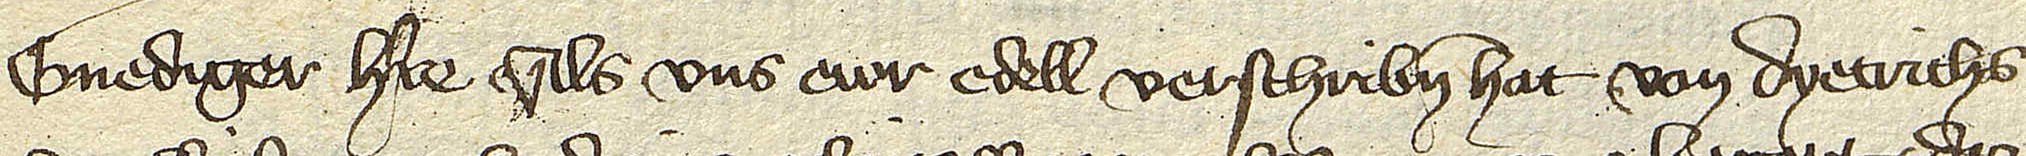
Gnediger h*re / Als vns ewr edell verſchribn* hat von Dyetrichs
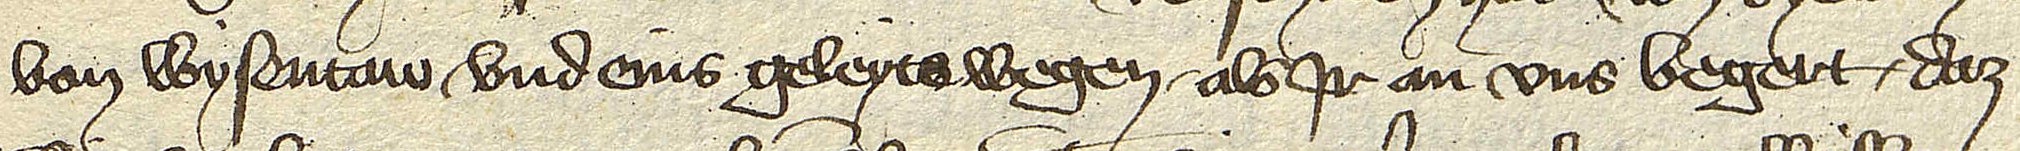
von wyſentaw / vnd eins geleyts wegen / als Ir an vns begert / daʒ
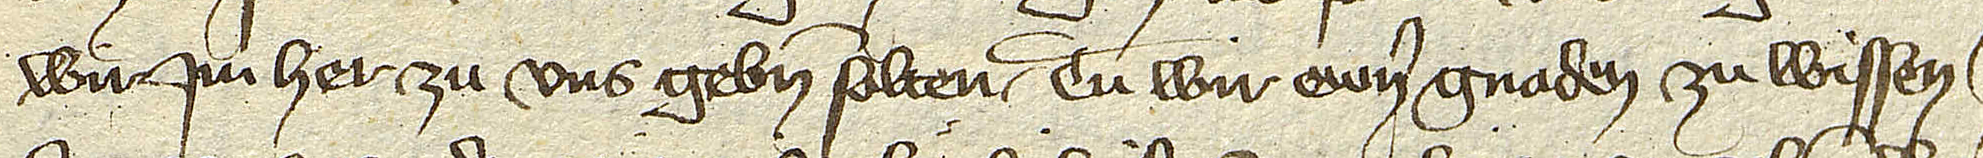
wir Im her cʒu vns gebn* ſolten / Tu wir ewn* gnaden cʒu wiſſen
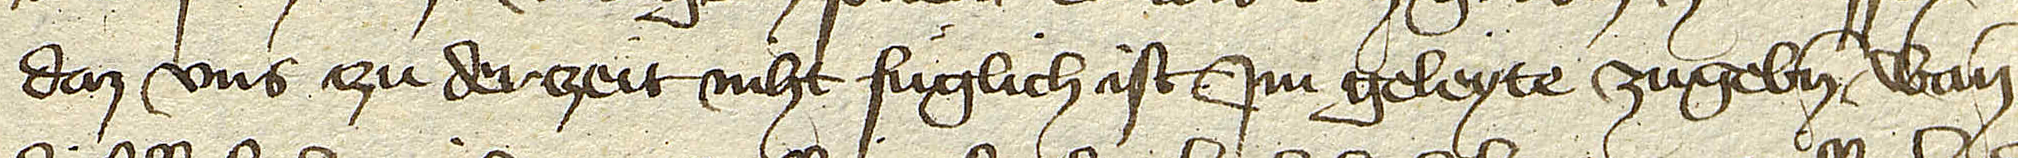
daʒ vns cʒu der cʒeit niht füglich iſt Im geleyte cʒugebn* / wan*
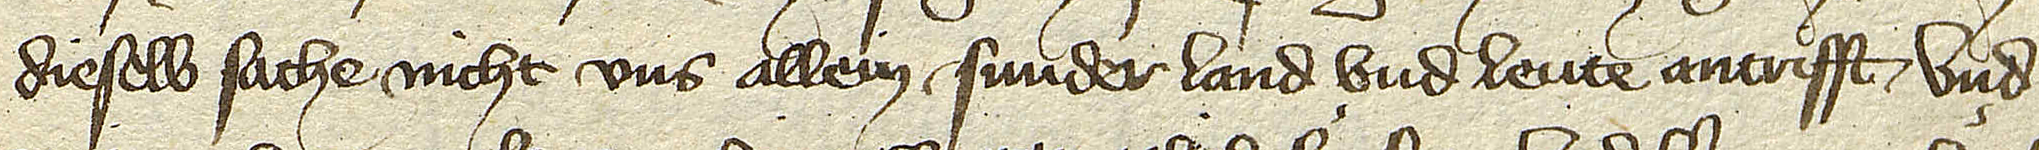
dieſelb ſache nicht vns allein / ſunder land vnd leute antrifft / vnd
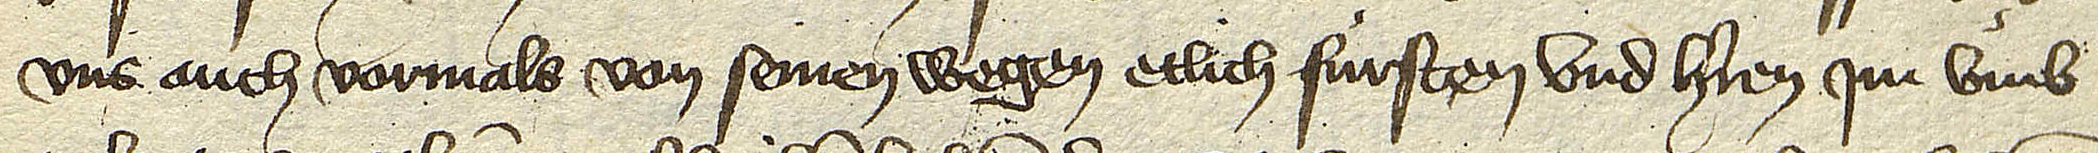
vns auch vormals von ſeinen wegen etlich fürſten vnd hr*en Im v̈mb
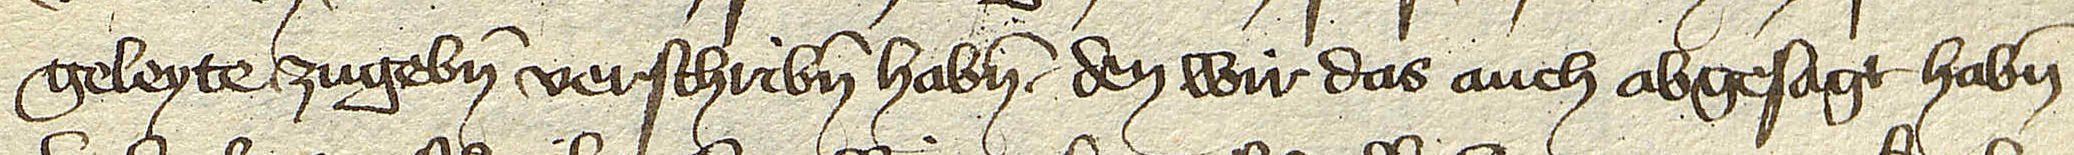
geleyte cʒugebn* verſchribn* habn* / den wir das auch abgeſagt habn*
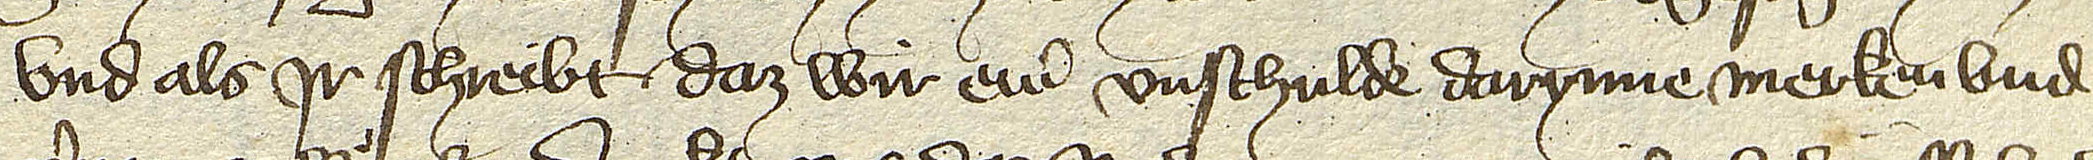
vnd als Ir ſchreibt / daʒ wir ew* vnſchulde darynne merken vnd
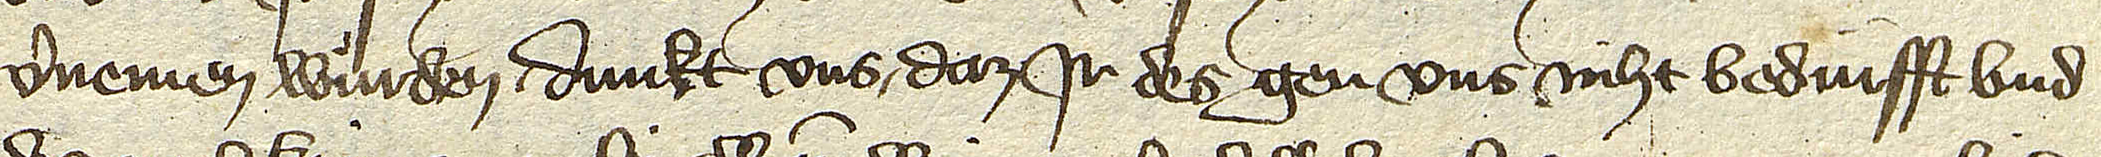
v*nemen würden / dunkt vns / daʒ Ir des gen vns niht bedürfft vnd
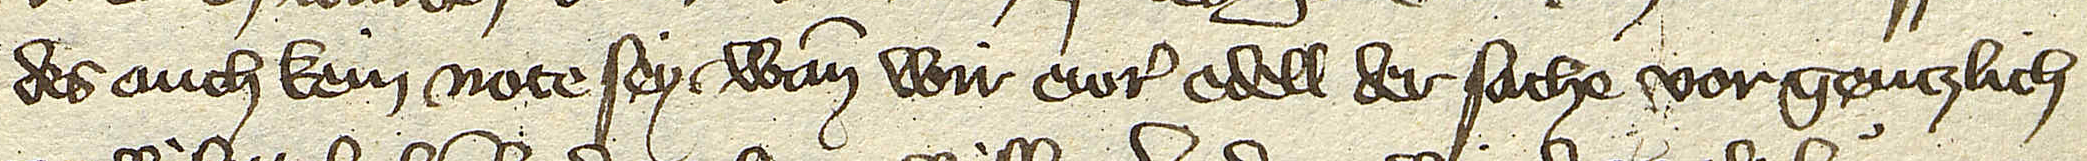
des auch kein note ſey / wan* wir ewr* edell der ſache vor gencʒlich
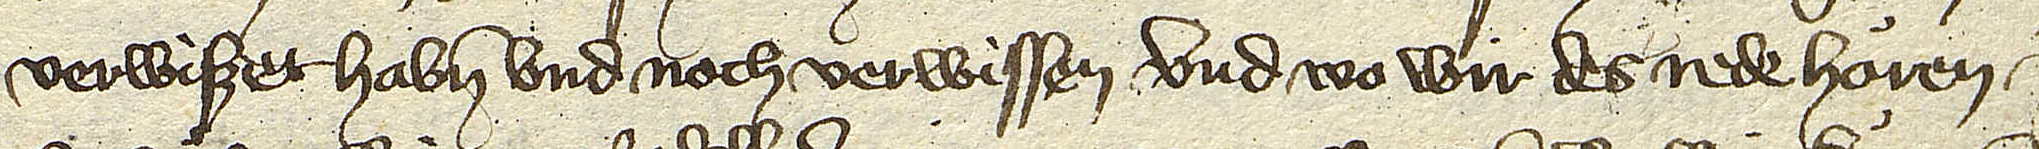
verwiſʒet habn* vnd noch verwiſſen / vnd wo wir des rede hören /
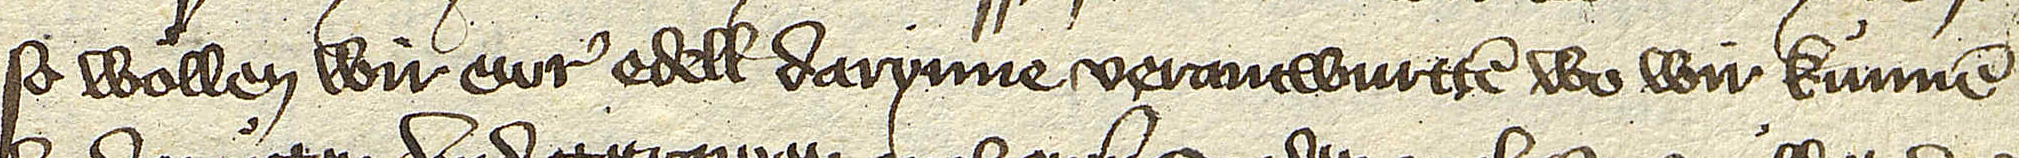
ſo wöllen wir ewr* edell darynne verantwurte* wo wir künne*
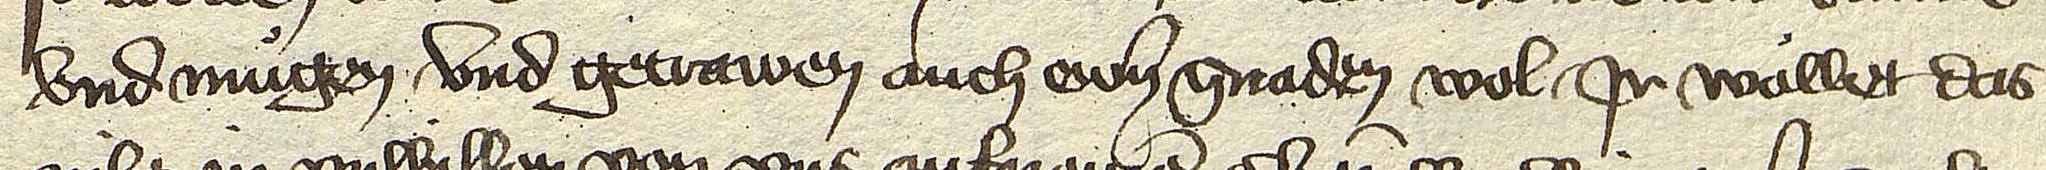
vnd mügen / vnd getrawen auch ew*n gnaden wol / Ir wöllet das
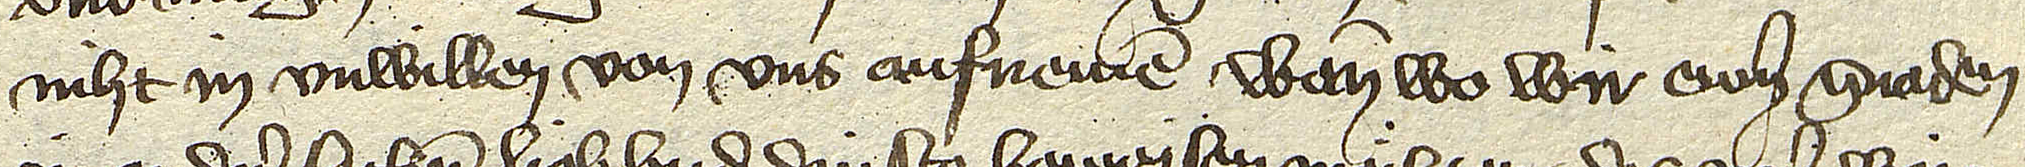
niht in vnwillen von vns aufneme* / wan* wo wir ewn* gnaden
